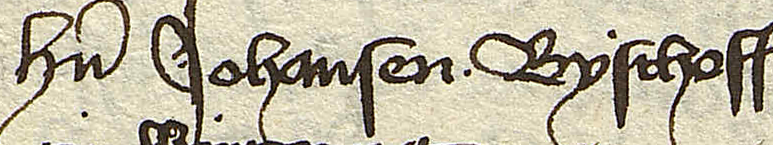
hn* Iohanſen . Byſchoff
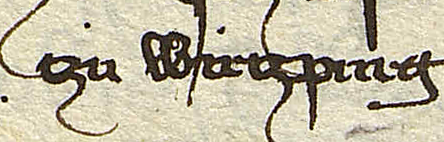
cʒu wircʒpurg
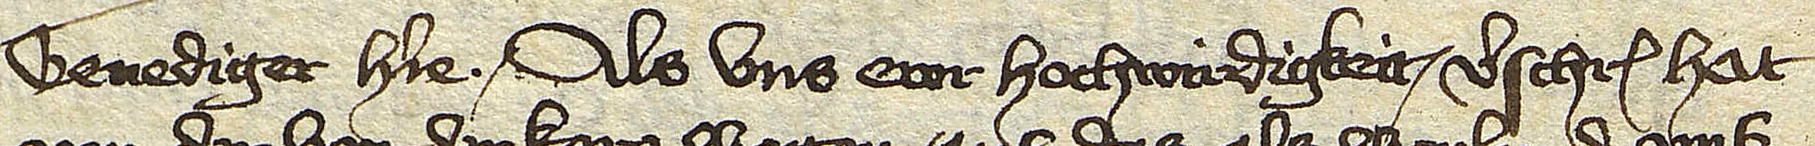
Gnediger h*re . / Als vnd ewr hochwirdikeit / v*ſchr* hat
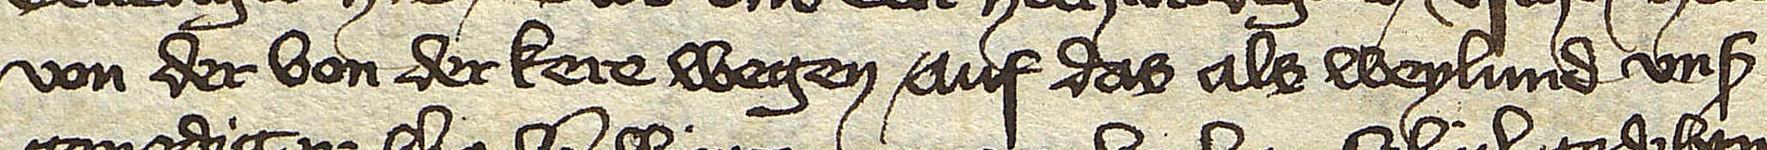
von der von der kere wegen / auf das als weylund vnſ*
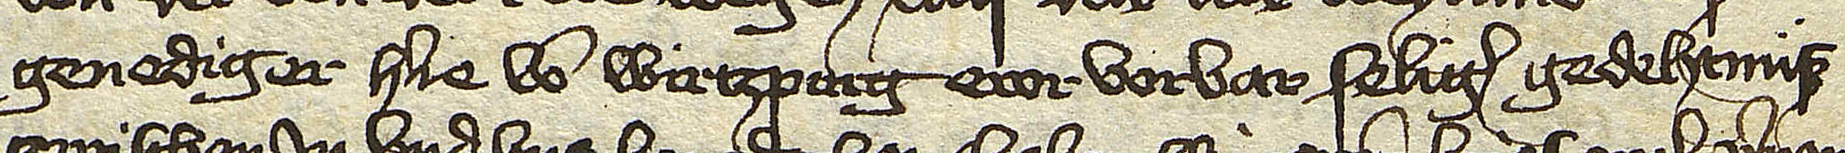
gnediger h*re vo* wircʒpurg ewr vorvar ſelig* gedehtnüſʒ
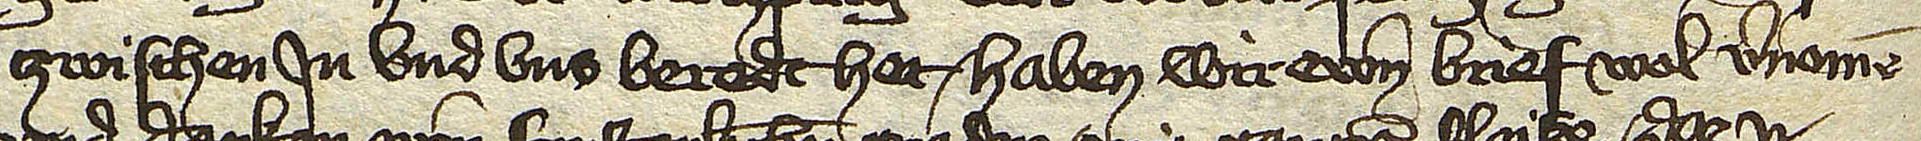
cʒwiſchen In vnd vns beredt het / haben wir ewn* brief wol v*nome*
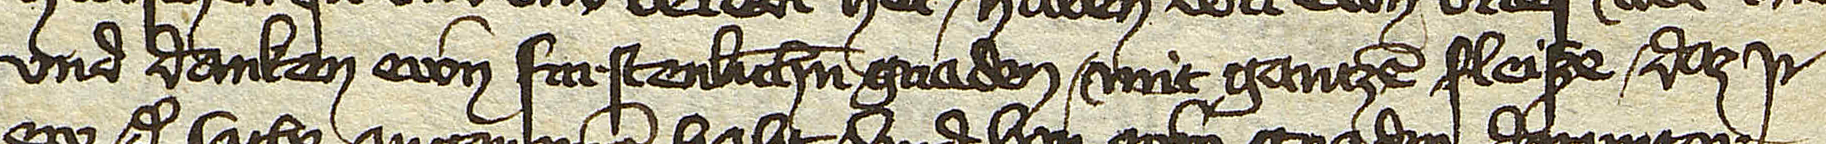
vnd danken ewn* furſtenlichn* gnaden mit gancʒe* fleiſʒe / daʒ Ir
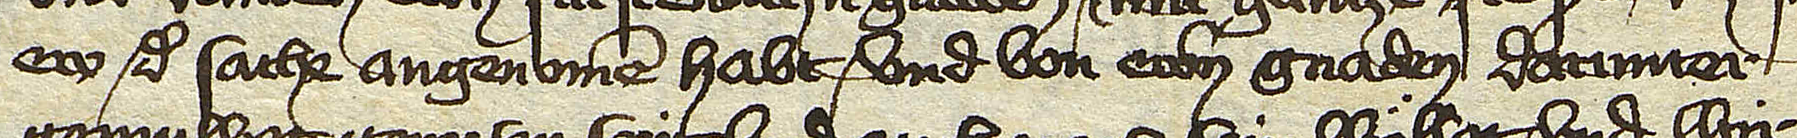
ew / d* ſache angenome* habt / vnd von ew*n gnaden darunter
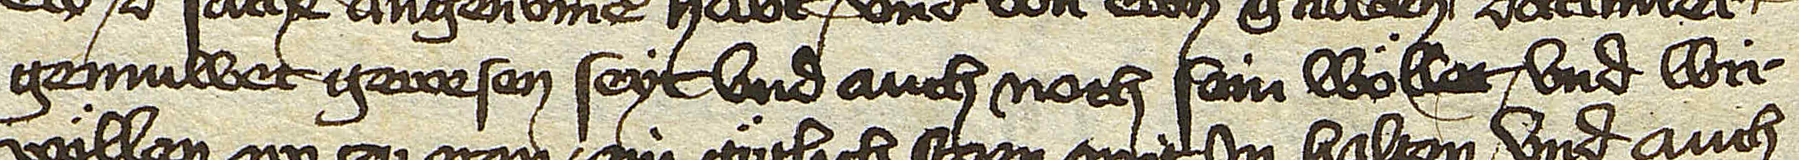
gemuwet geweſen ſeyt vnd auch noch ſein wöllet / vnd wir
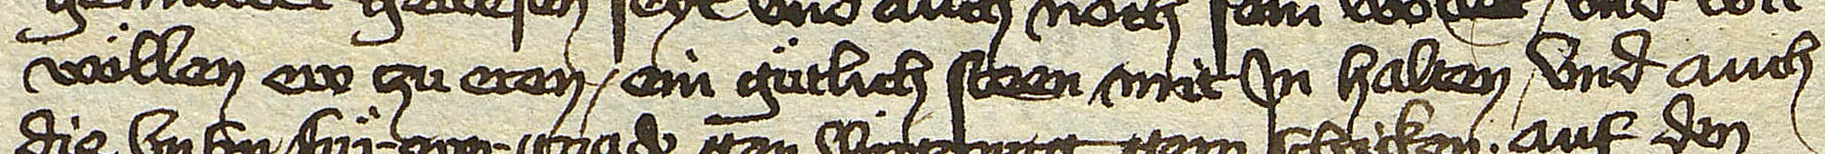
wöllen ew cʒu eren / ein gütlich ſteen mit In halten / vnd auch
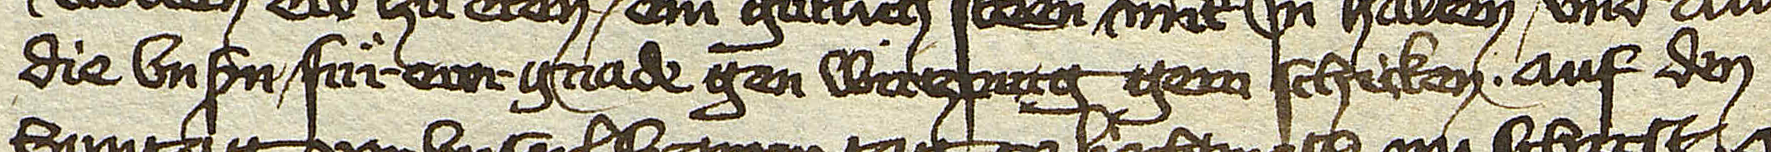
die vnſ*n / für ewr gnade gen wircʒpurg gern ſchicken . auf den
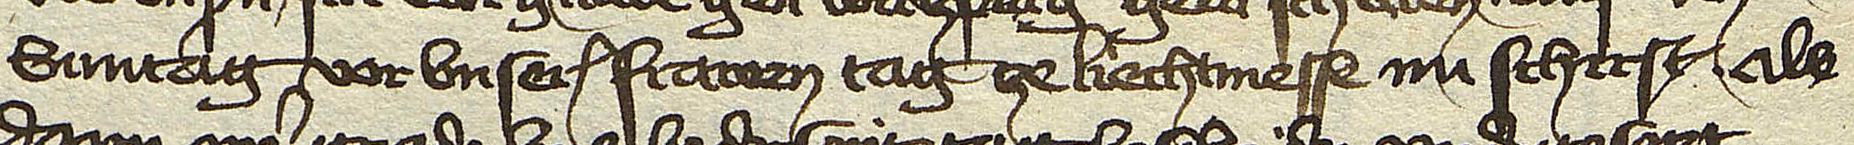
Suntag vor vnſer* frawen tag cʒe liechtmeſſe nu ſchirſt /. als
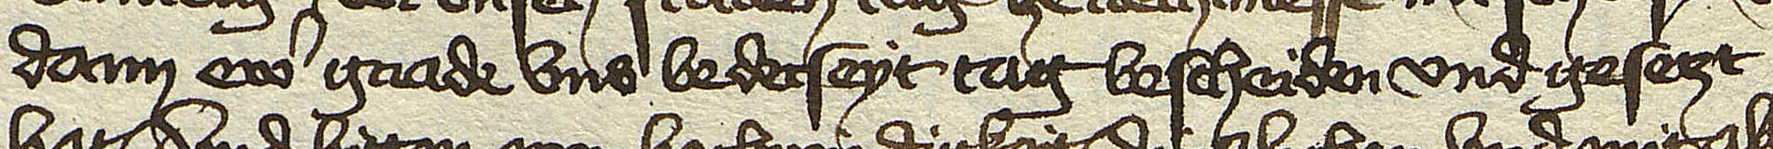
dann ew* gnade vns bederſeyt tag beſcheiden vnd geſecʒt
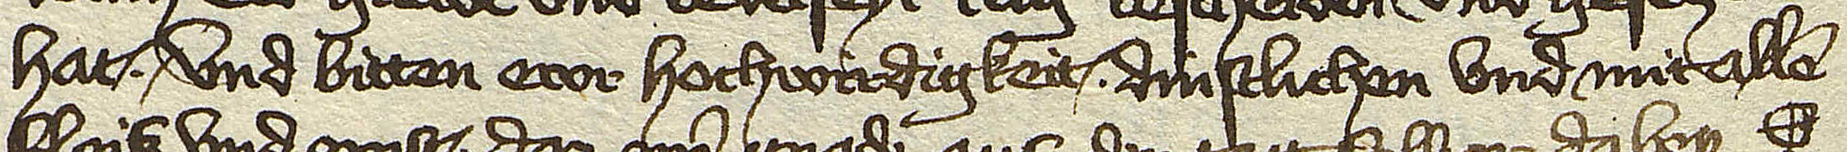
hat . / vnd bitten ewr hochwirdigkeit / . dinſtlichen vnd mit alle*
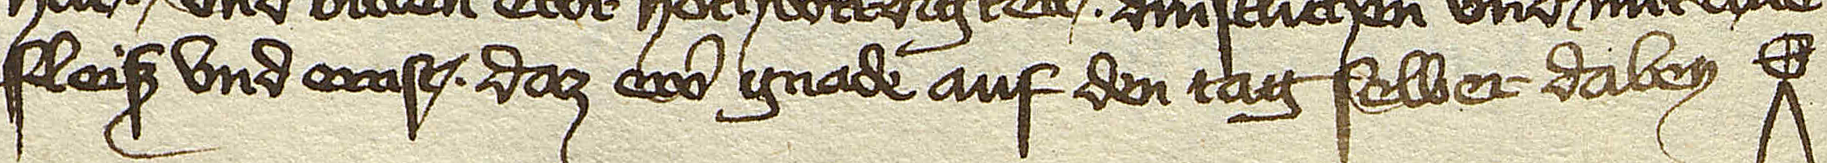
fleiſʒ vnd ernſt / . daʒ ew* gnade auf den tag ſelber dabey %
